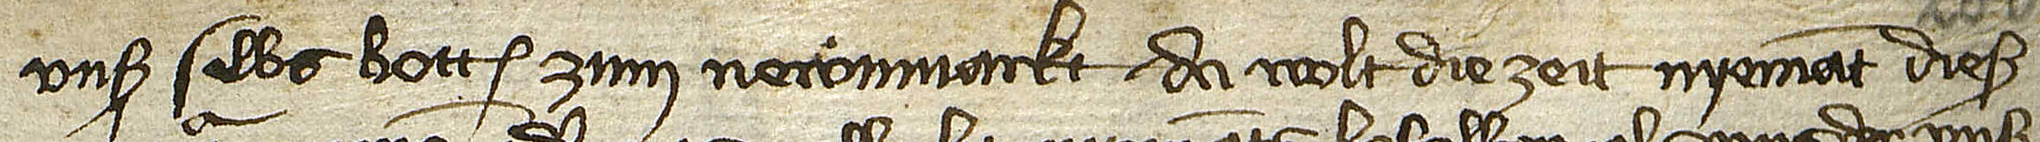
vnſ* ſelber bott* ʒum neẅnmarkt / da wolt die ʒeit nyemat* dieſ*
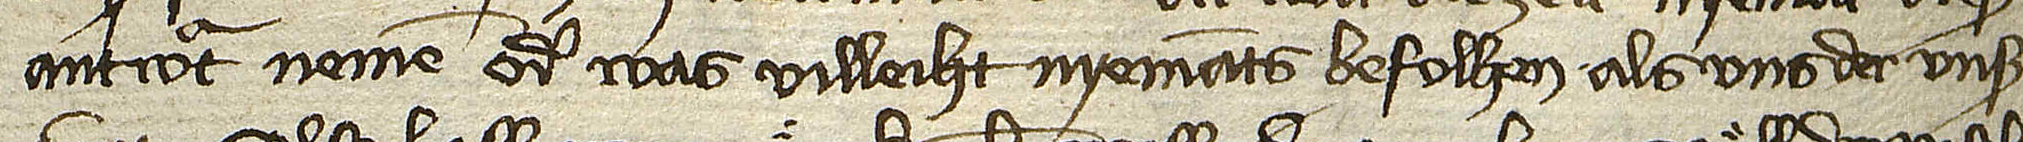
antw*t neme* od* was villeiht nyem*ats befolhen . als vns der vnſ*
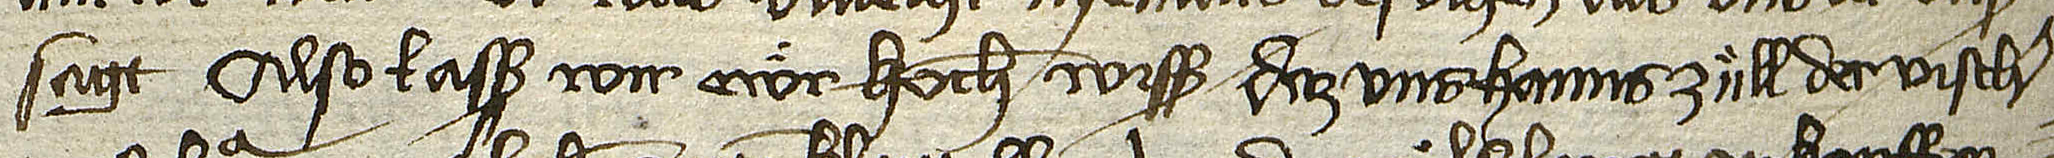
ſagt Alſo laſſ* wir eẅr hoch* wiſſ* / daʒ vns hanns ʒüll der viſch*
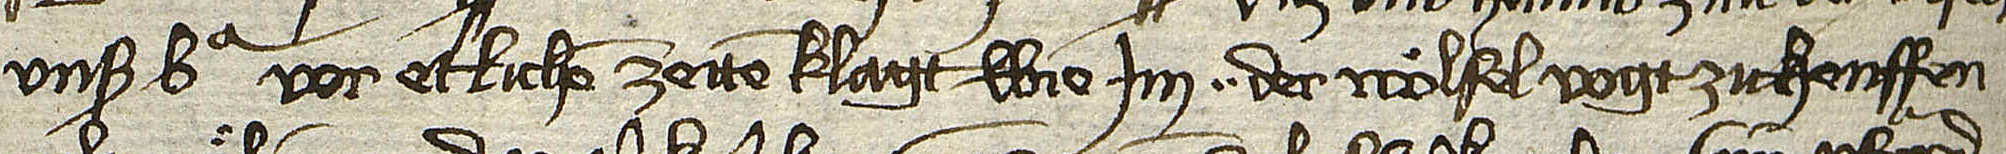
vnſ* b* vor etliche* ʒeite* klagt wie Im ~ der wölfel vogt ʒuhenffen =
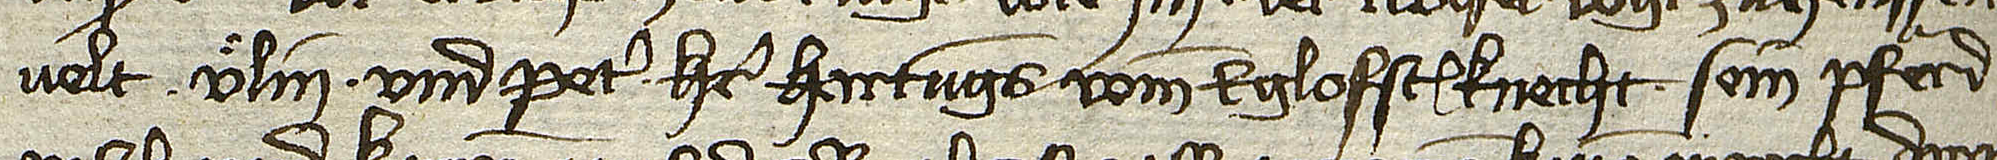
uelt . v̈lin . vnd Pet* . h*r hart*ugs vom* Eglofſt* knecht . ſein pfërd
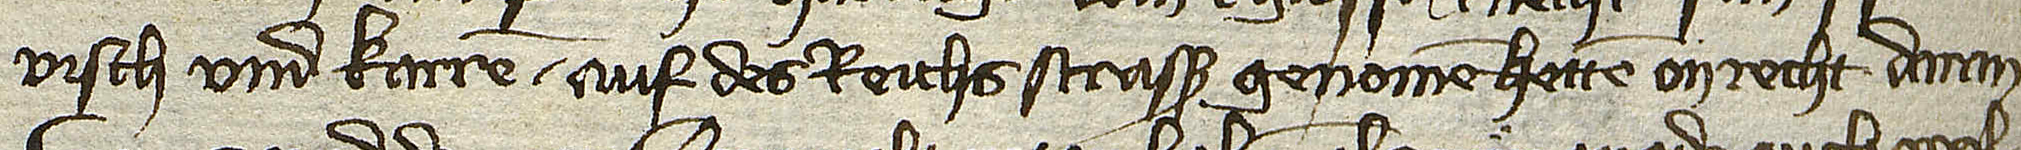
viſch vnd karre* / auf des Reichs ſtraſſ* genome* hette* on recht daran
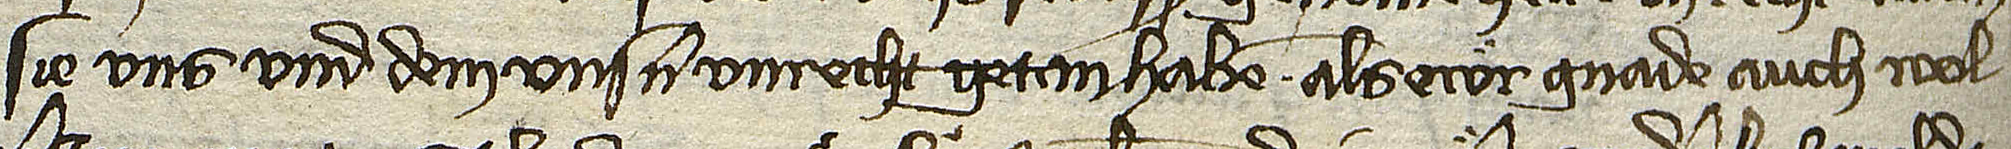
ſie vns vnd dem vnſ*n vnrecht getan habe* . als eẅr gnade auch wol
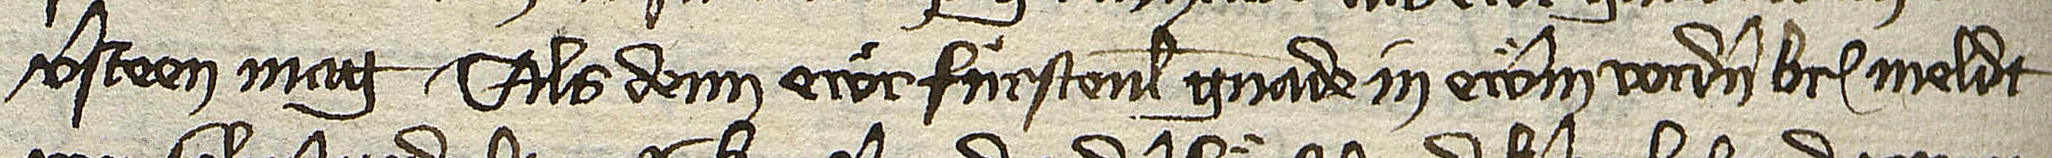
v*ſteen mag / Als denn eẅr fürſtenl* gnade in eẅm* vord*n br* meldt
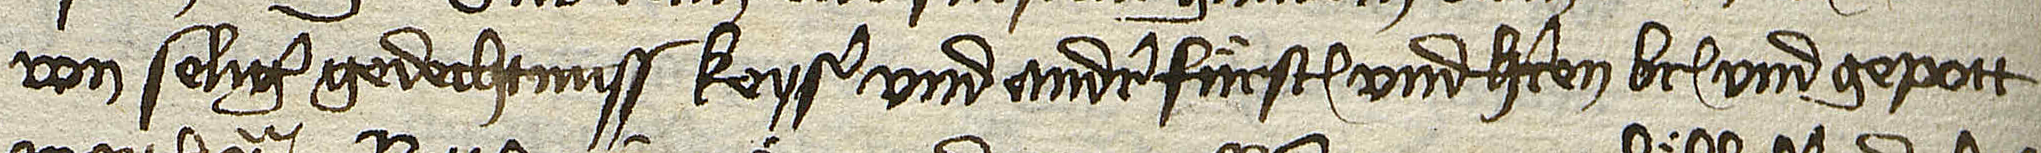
von ſelig* gedechtnuſſ keyſ* vnd and*r fürſt* vnd h*ren br* vnd gepott
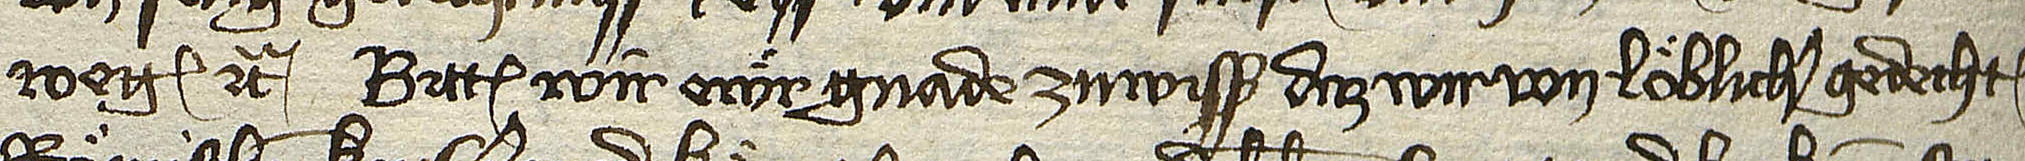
weg* ec* Bitt* wir eẅr gnade ʒu wiſſ* daʒ wir von löblich* gedecht*
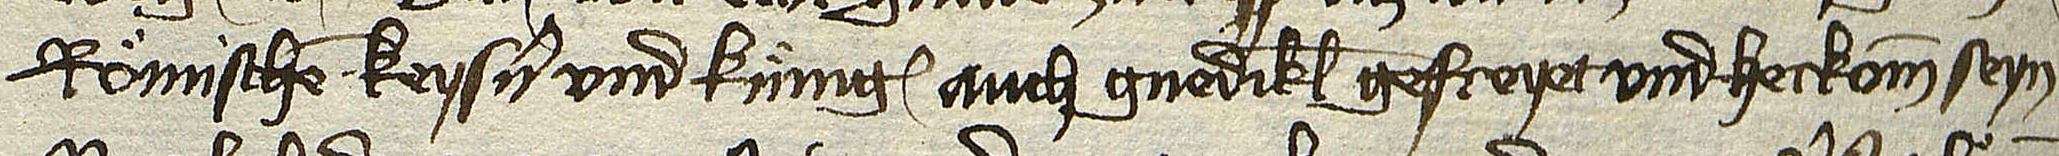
Römiſche* . keyſ*n vnd künig* auch gendikl* gefreyet vnd herkom* ſeyn
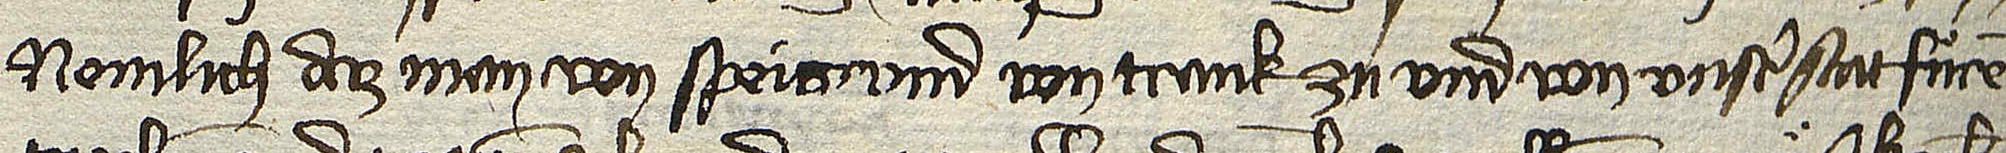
Nemlich daʒ man von ſpeis vnd von trank ʒu vnd von vnſ*r ſtat füre*
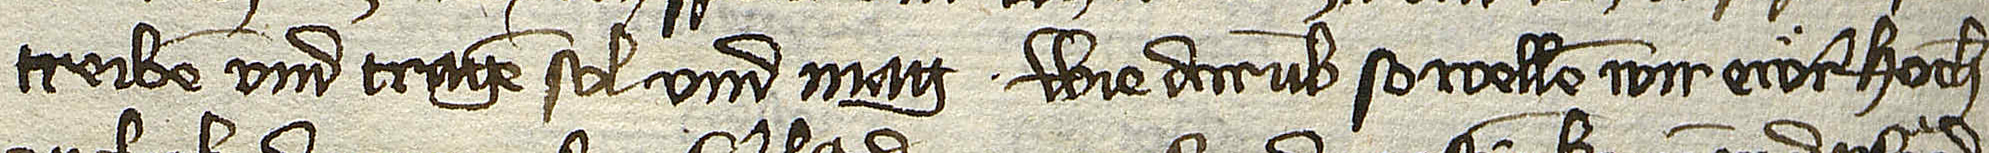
treibe* vnd tra*ge ſol vnd mag . Wie darub* ſo welle* wir eẅr* hoch*
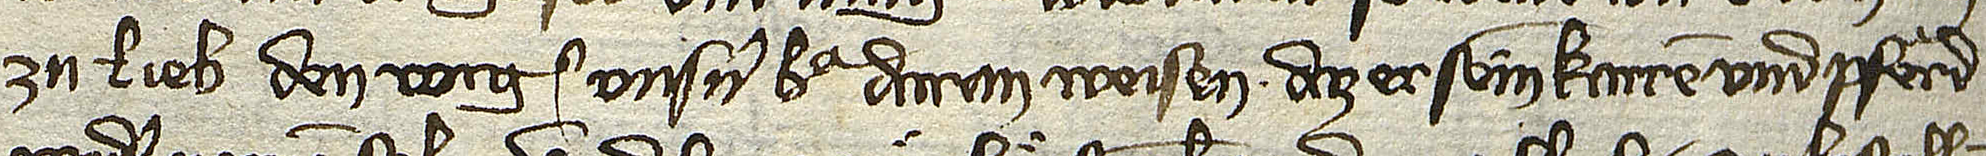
ʒu lieb den vorg* vnſ*n b* daran weiſen . daʒ er ſein karre* vnd pfërd
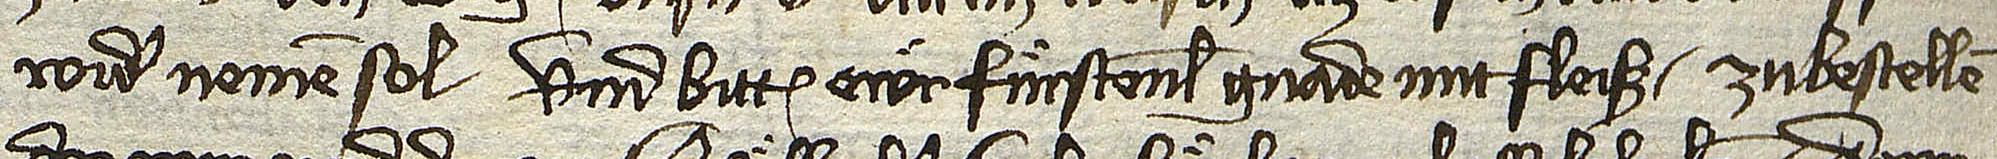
wid* neme* ſol Vnd bitt* eẅr fürſtenl* gnade mit fleiſʒ / ʒu beſtelle*
